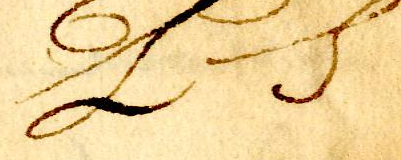PS
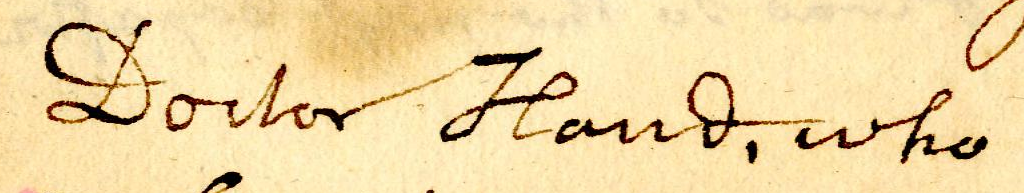Doctor Hand, who
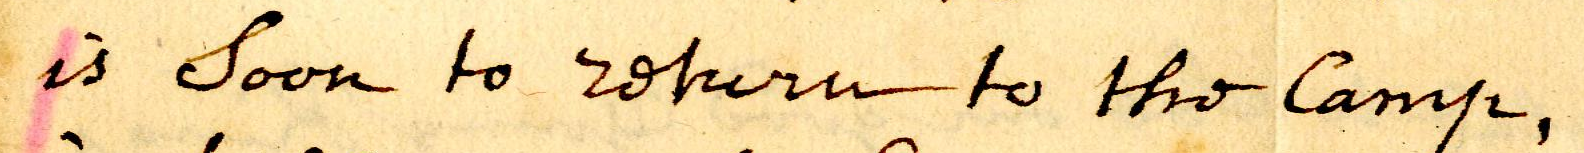is soon to return to the Camp,
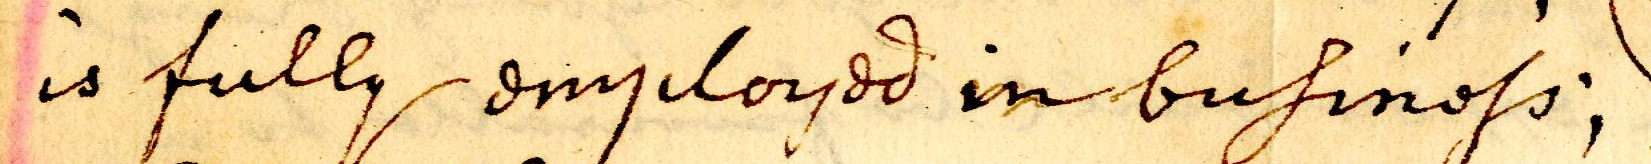is fully employed in business;
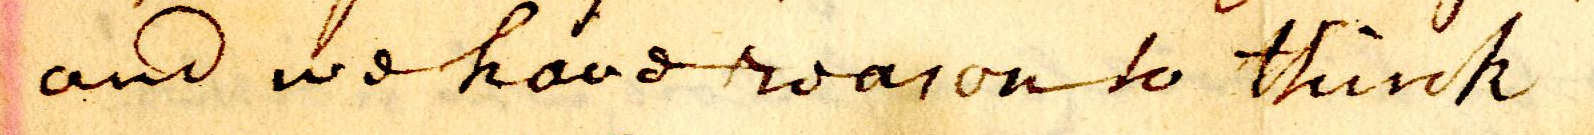and we have reason to think
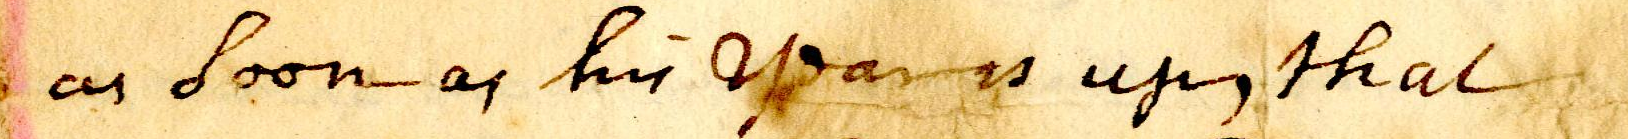as soon as his Year is up, that
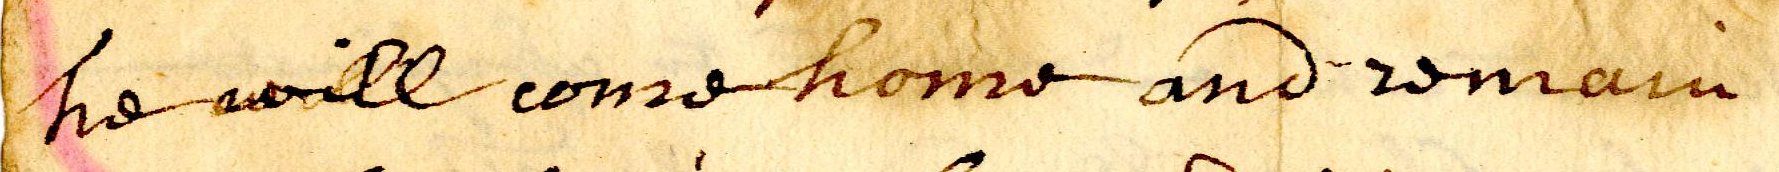he will come home and remain
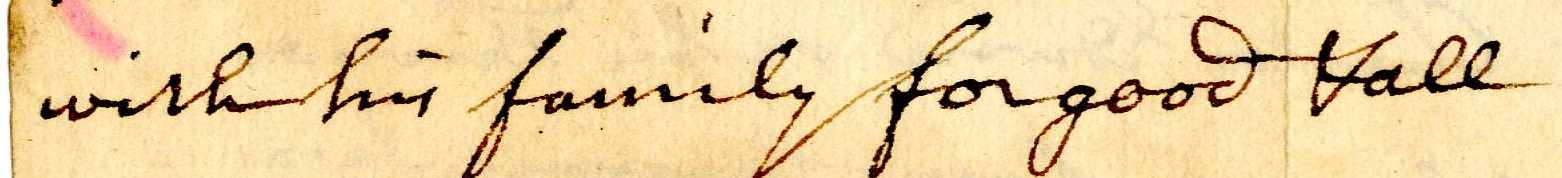with his family for good & all
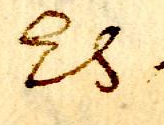ES.
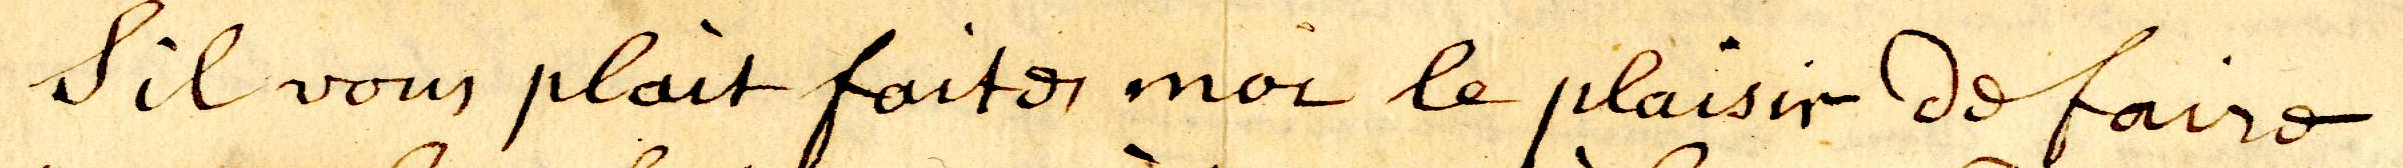Sil vous plait faites moi le plaisin de faire
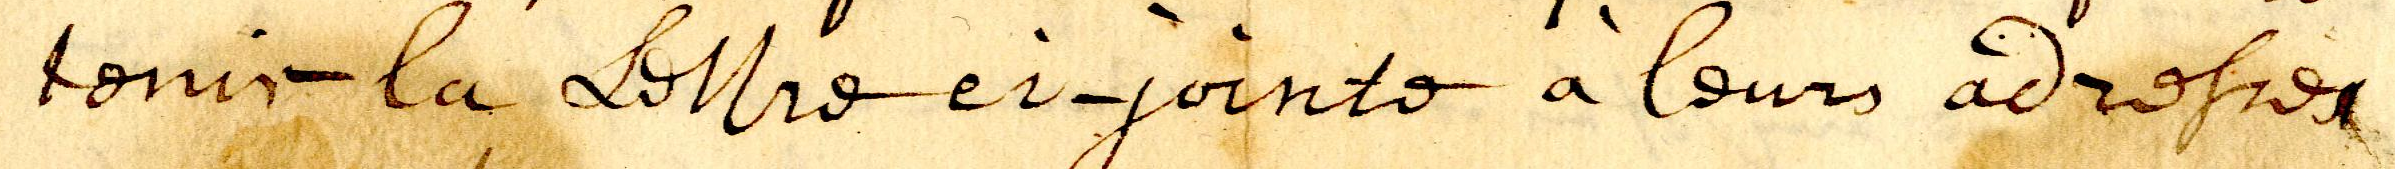tenir la Lettre ei-jointe à Cours adresses
